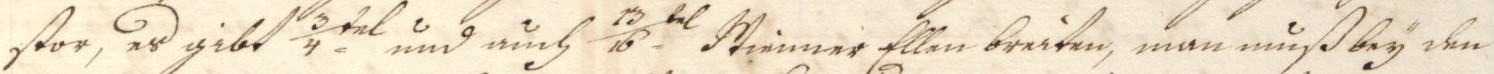stor, es gibt 3/4tel und auch 13/16tel Wienner Ellen breiten, man muß bey den
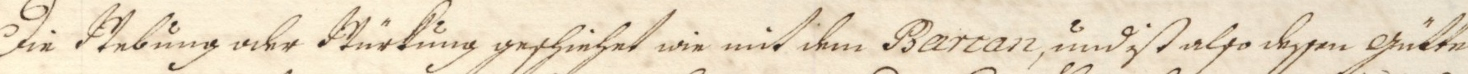Die Webung oder Würkung geschiehet wie mit dem Barcan, und ist also dessen Gütte
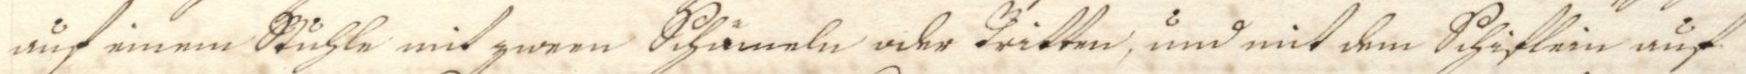auf einem Stuhle mit zween Schämeln oder Tritten, und mit dem Schiflein auf
